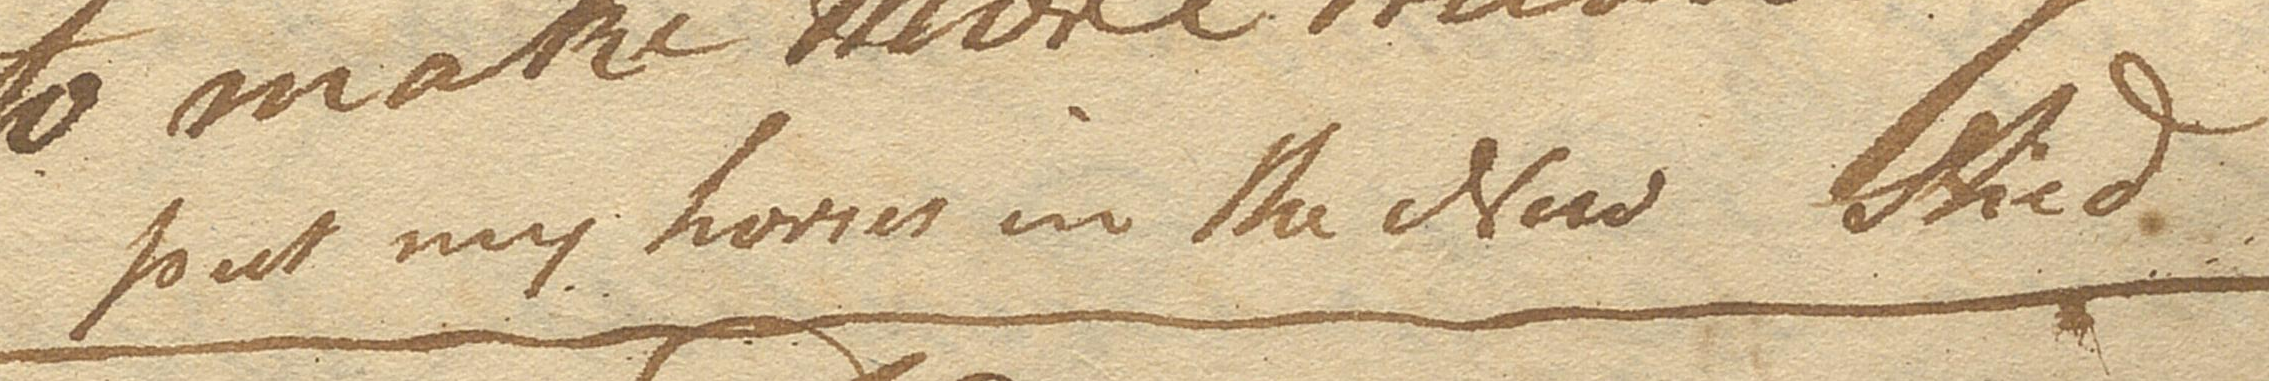put my horses in the New Shed.
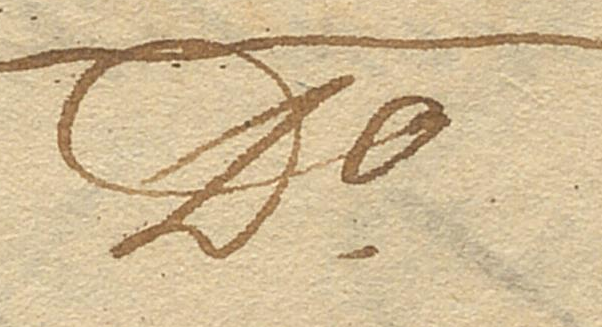D^o.
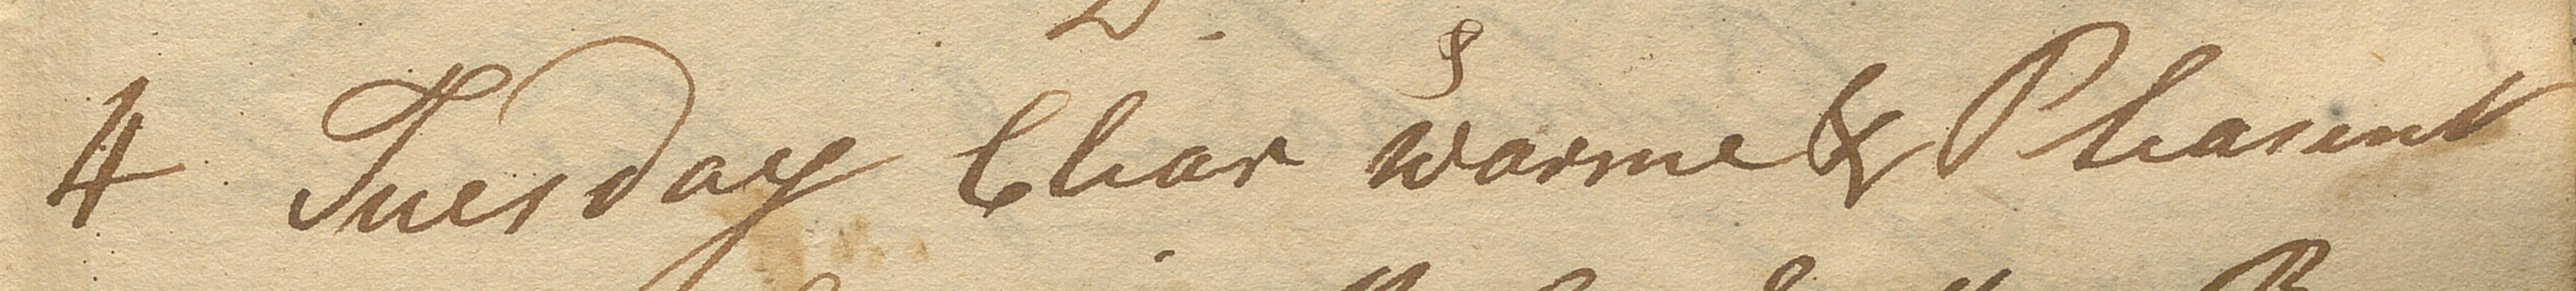4 Tuesday Clear warme & Pleasent
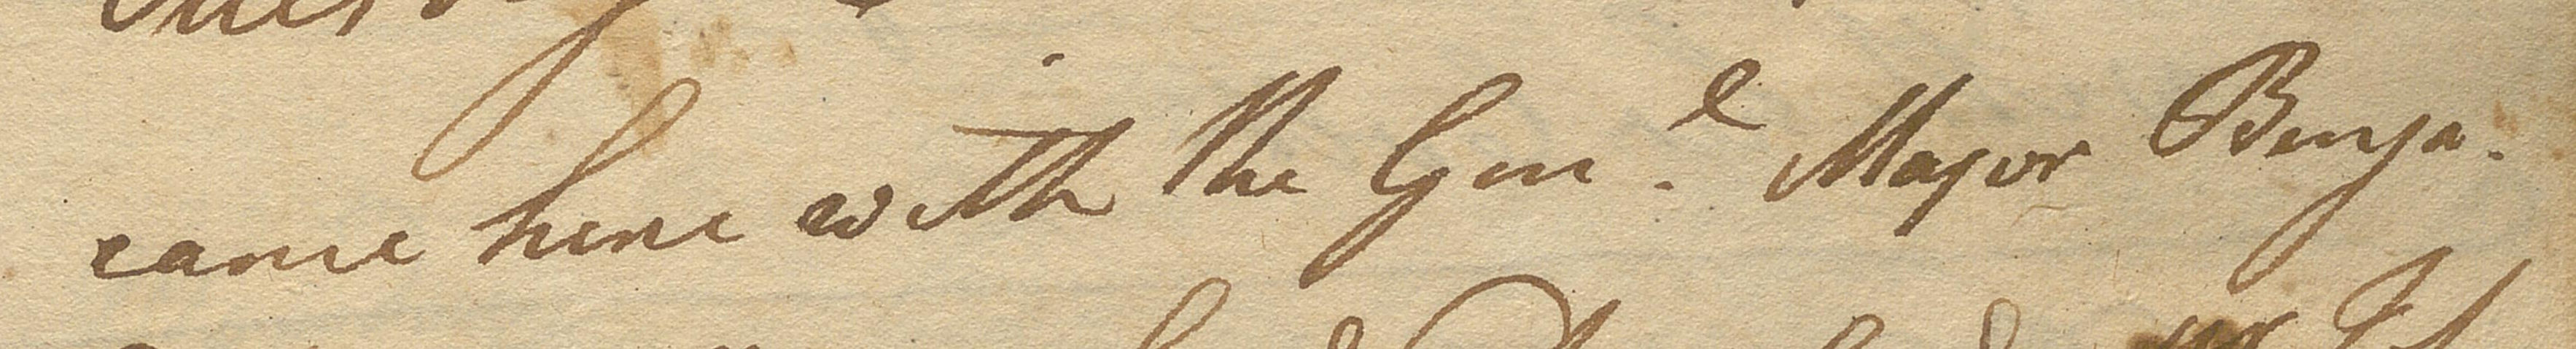came here with the Gen^l. Major Benja.
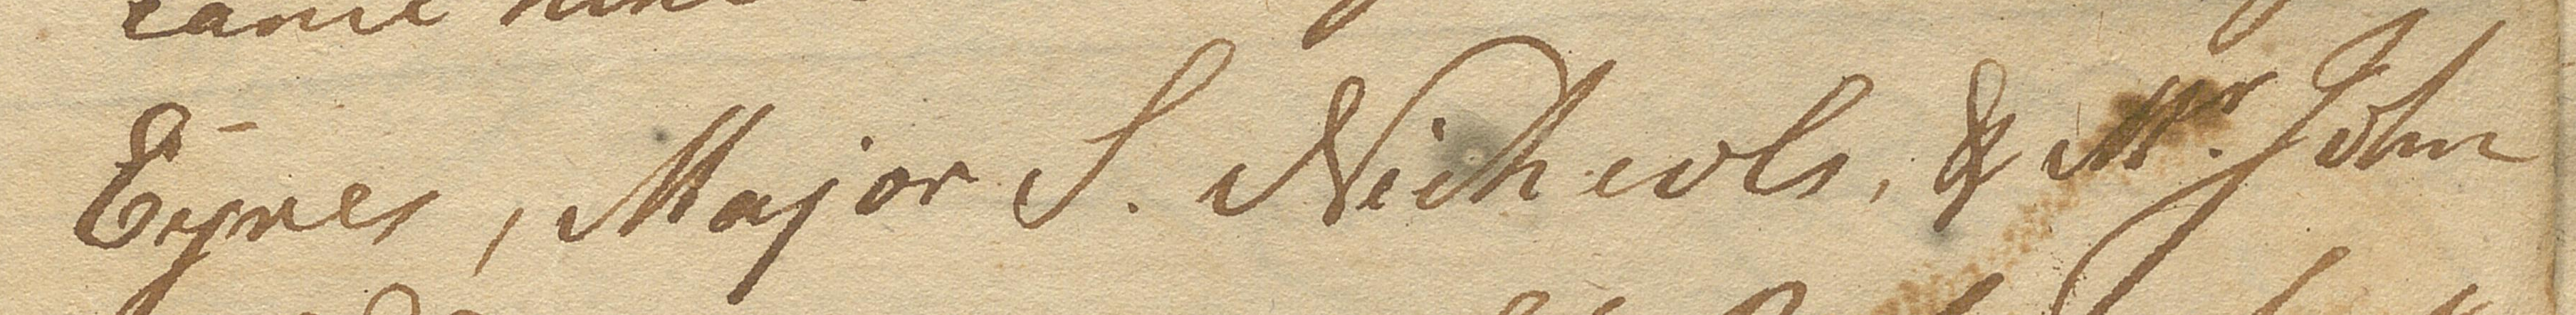Eyres, Major S. Nichcols, & M^r. John
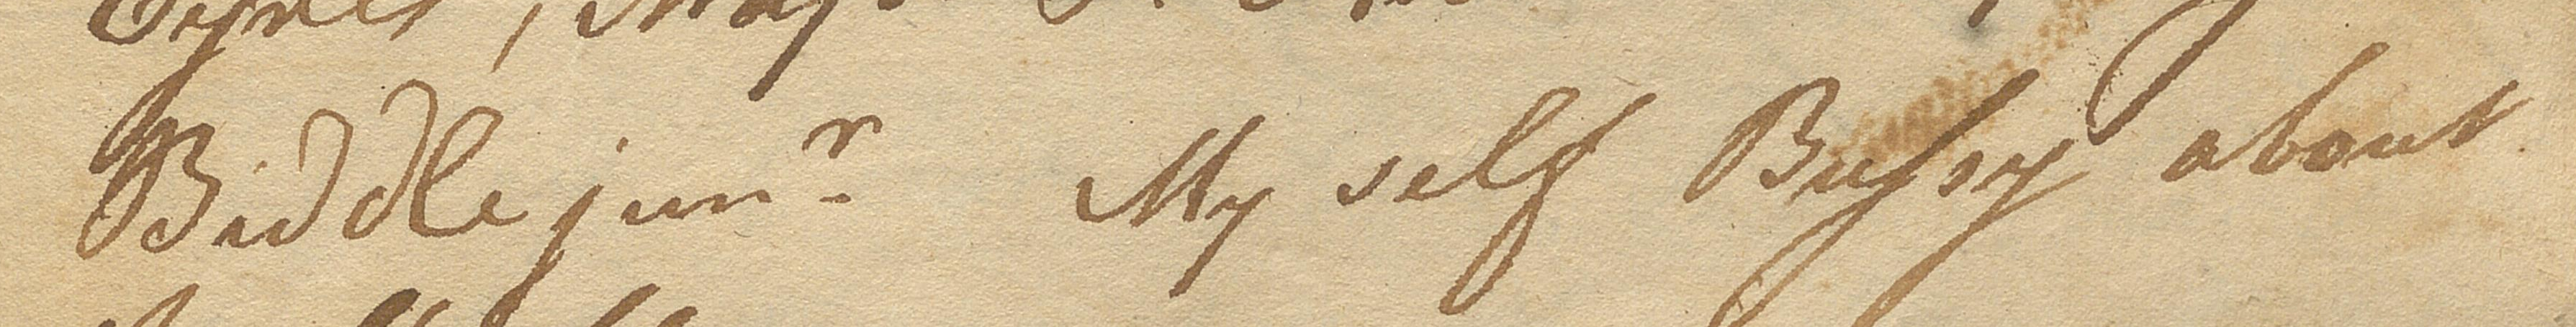Biddle jun^r. My self Bussy about
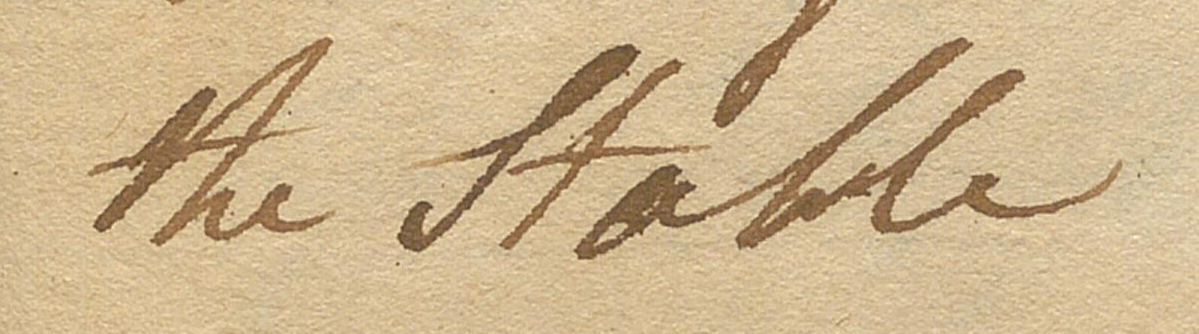the Stable
